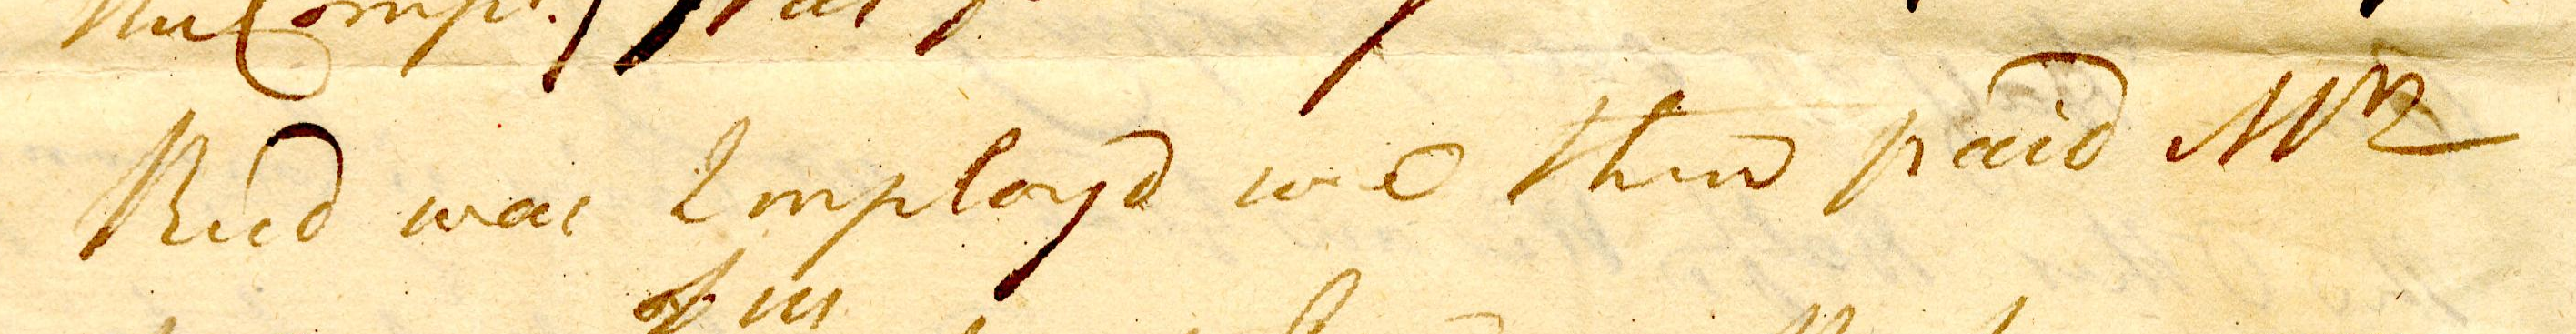Reed was Employd we then paid M^r
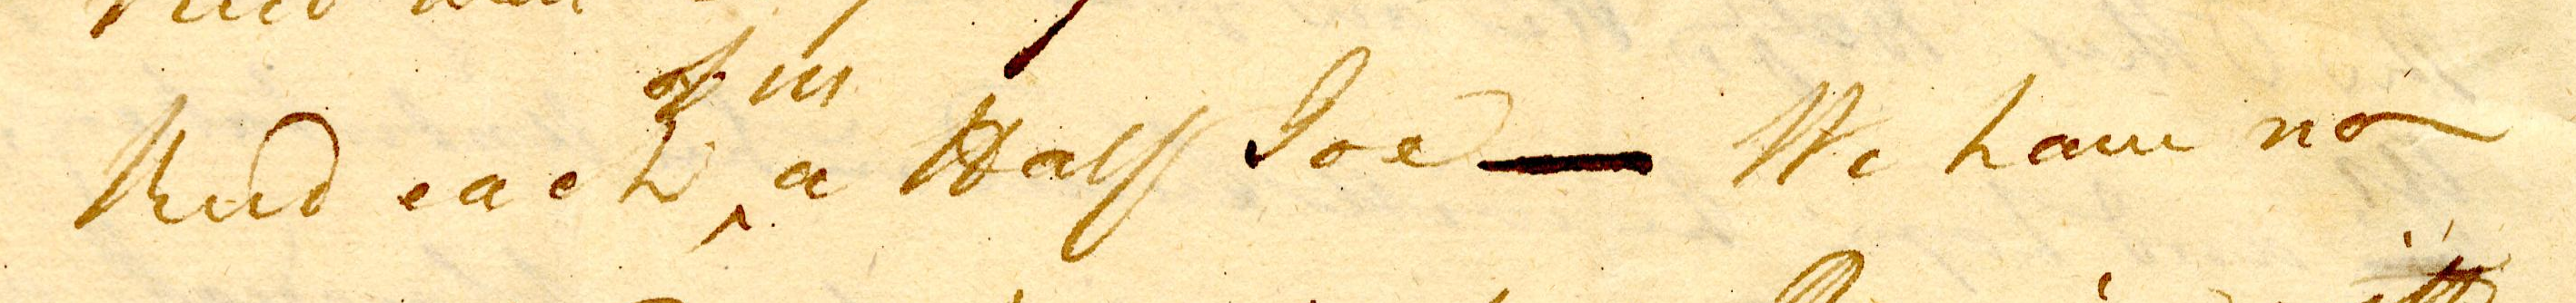Reet each a Half Joe- We have no
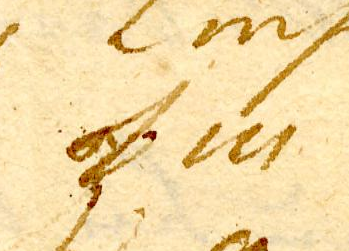of us
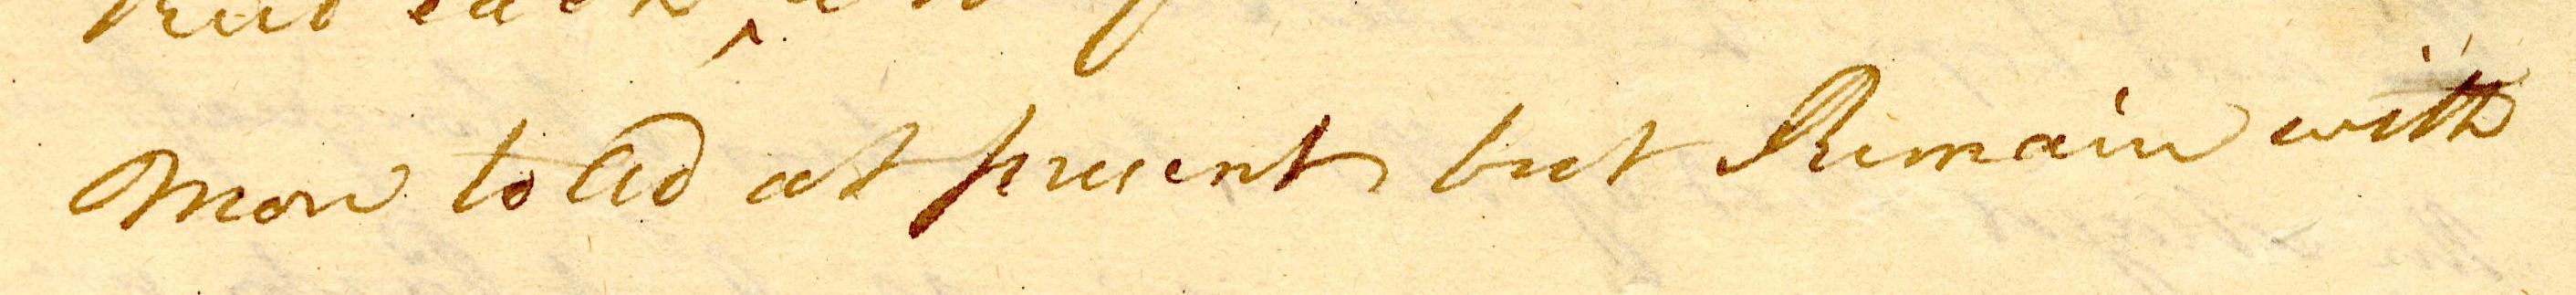more to Ad at present but Remain with
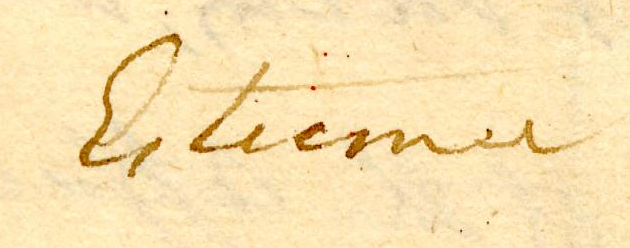Esteeme
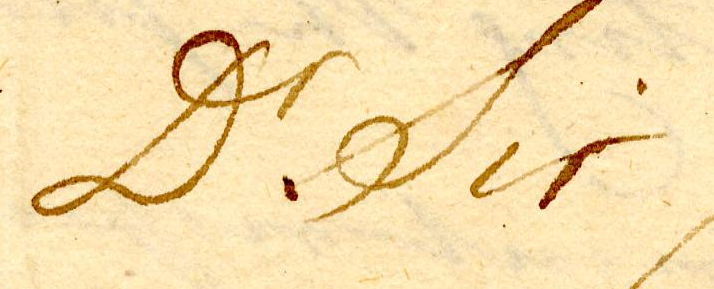D^r. Sir
